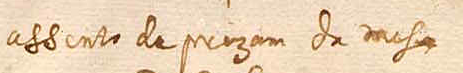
assento da prizam da mesa
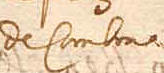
de Coimbra
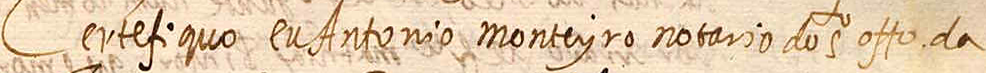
Certefiquo eu Antonio monteyro notario do sto offo. da
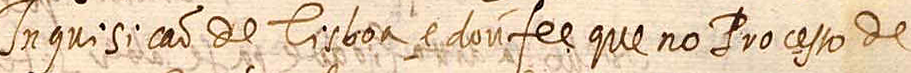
Inquisiçaõ de lisboa e dou fee que no Processo de
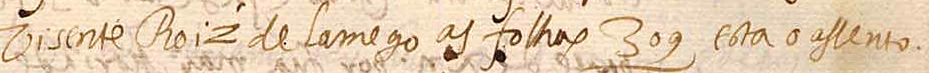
visente Roiz̄ de lamego as folhas 309 esta o assento
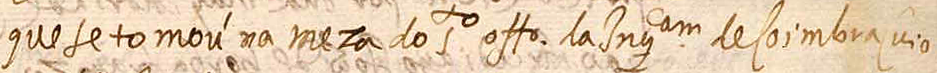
que se tomou na meza do sto offo. da Inqcam. de Coimbra Cuio
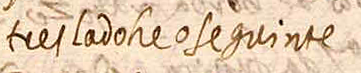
treslado he o seguinte
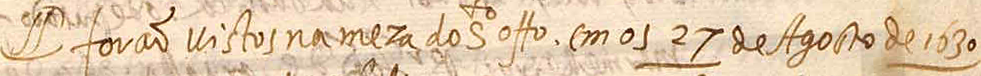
¶ foraõ uistos na meza do Sto offo em os 27 de Agosto de 1630
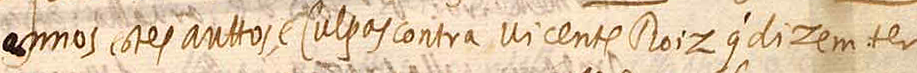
annos estes auttos, e Culpas contra uicente Roiz q̄ dizem ter
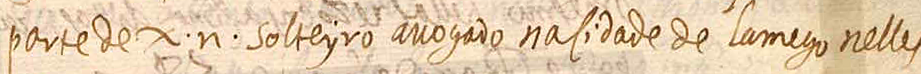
parte de x. n. solteyro auogado na Cidade de lamego nelles
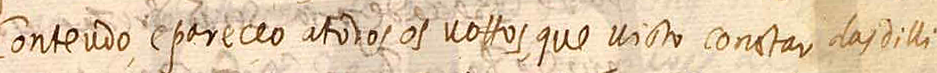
Conteudo, e pareceo a todos os uottos, que uisto constar das dilli
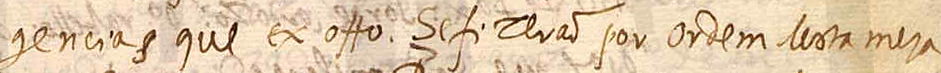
gencias o que ex offo. Se fizeraõ por ordem desta meza
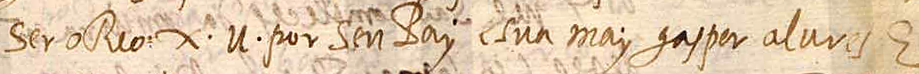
Ser o Reo x. u. por seu Pay e sua may gaspar alures E
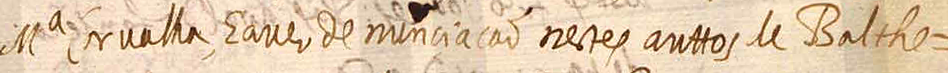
Ma Carualha, E auer denunciçaõ nestes auttos de Balthe
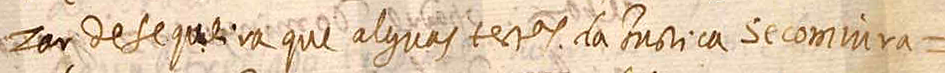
zar de sequeira que alguas testas. da Iustica se comiura
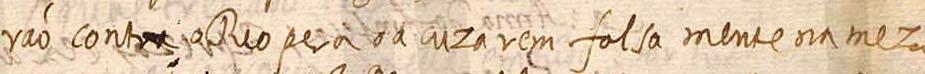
raõ contra o Reo pera o acuzarem falsamente na meza
